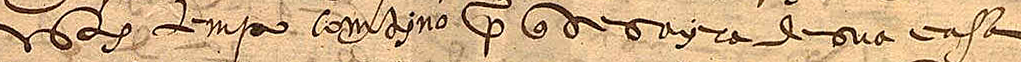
este tempo comtyno p̄o q̄ se sayra de sua casa
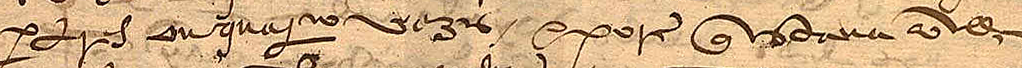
ꝑ tres ou quatro vezes / e porē q̄ estaua c̄o elle
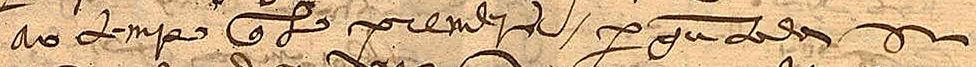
ao tempo q̄ ho prenderē / ꝑḡutada se
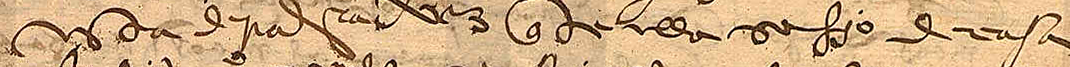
esta deradjra vez q̄ se ella sahyo de casa
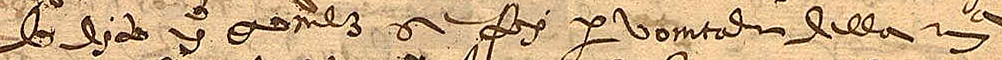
do dyto yo gomez se foy ꝑ vomtade della ma
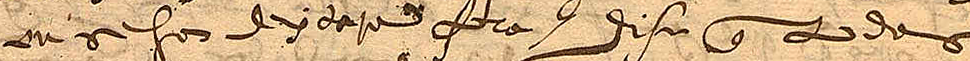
ou se ha deytarā fora / dise q̄ todas
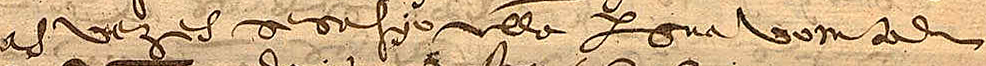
as vezes se sahyo ella ꝑ sua vomtade
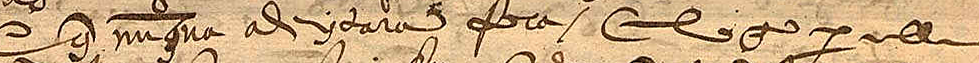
e q̄ n̄uqua a deytarā fora / E logo ꝑ elle
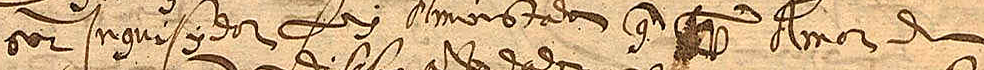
sōr Jnquisydor foy Amoestada q̄ p̄o Amor de
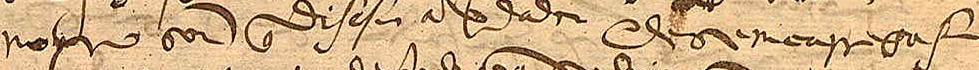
nosso sōr q̄ disese a ꝟdade e desemcarregase
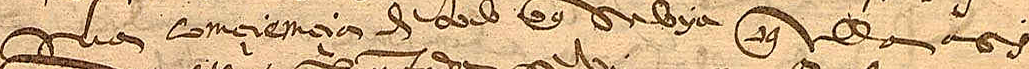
sua comçiemçia de todo o q̄ sabya o q̄ ella asy
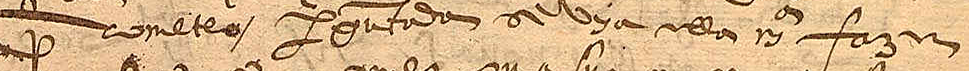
p̄rometeo / ꝑḡutada se vya ella ma fazer
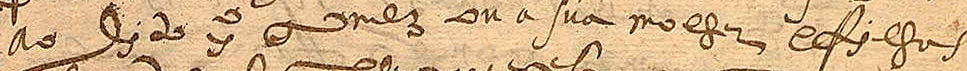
ao dyto yo gomez ou a sua molher e fylhas
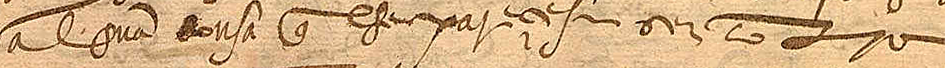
alguā cousa q̄ lhe pareçese ser c̄otra
